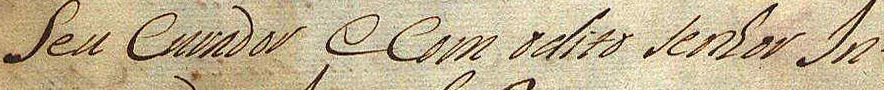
Seu curador e com o dito senhor In
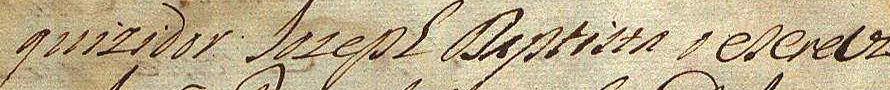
quizidor Iozeph Baptista o escrevi
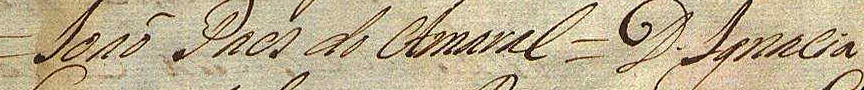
Ioaõ Paes do Amaral = D. Ignacia
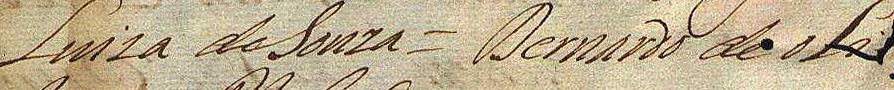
Luiza de Souza = Bernardo de oLi
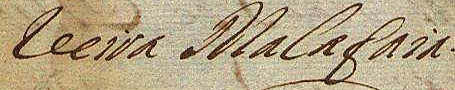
Veira Malafaia.
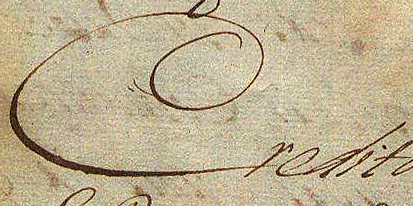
Credito
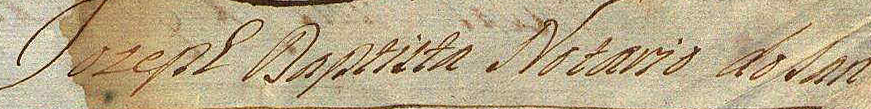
Jozeph Baptista Notario do san
